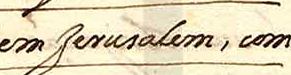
em Jerusalem, com
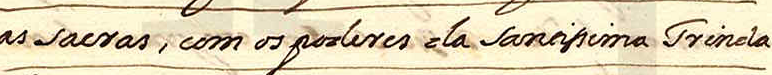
as sacras, com os poderes da Santissima Trinda
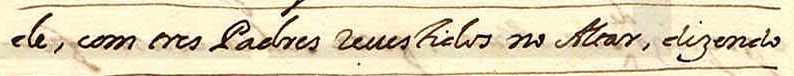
de, com tres Padres reuestidos no Altar, dizendo
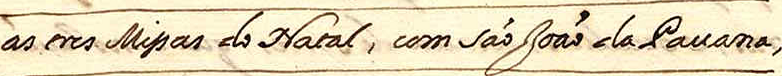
as tres Missas do Natal, com Saõ Joaõ da Pauana,
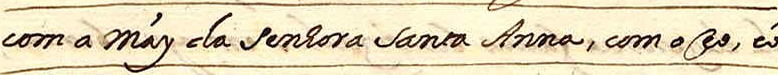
com a mãy da Senhora Santa Anna, com o Ceo, cõ
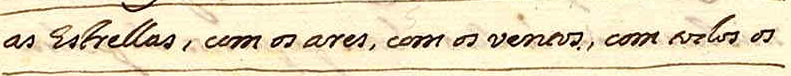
as Estrellas, com os ares, com os ventos, com todos os
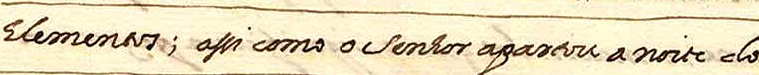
Elementos; assi como o Senhor apartou a noite do
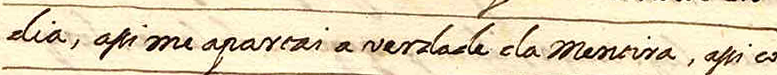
dia, assi me apartai a verdade da mentira, assi co
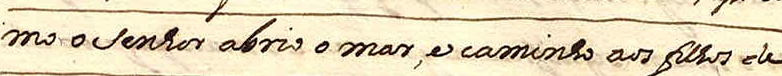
mo o Senhor abrio o mar, e caminho aos filhos de
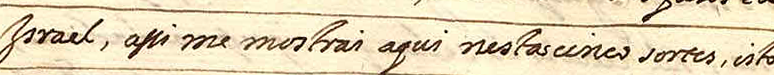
Jsrael, assi me mostrai aqui nestas cinco sortes, isto
